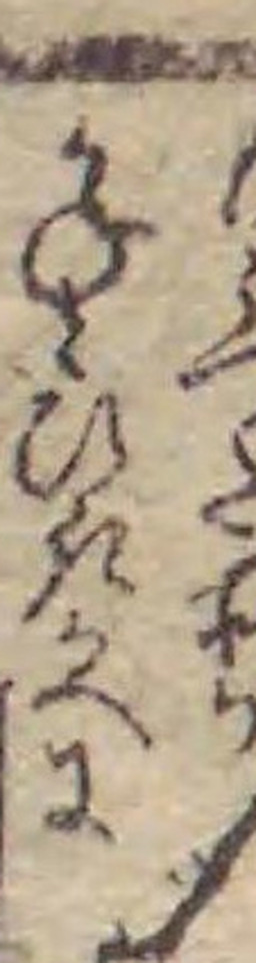かねとひきかへに
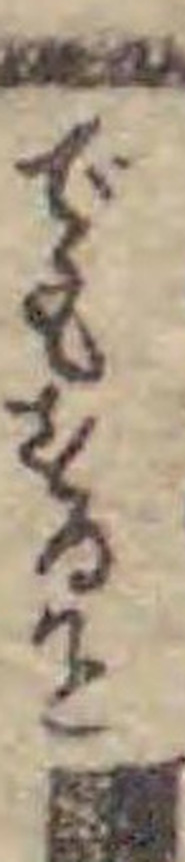でもするかと
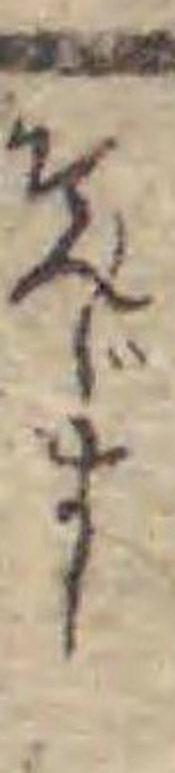そんじまし
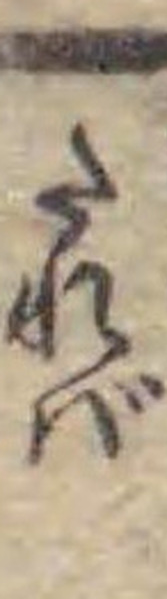たれば
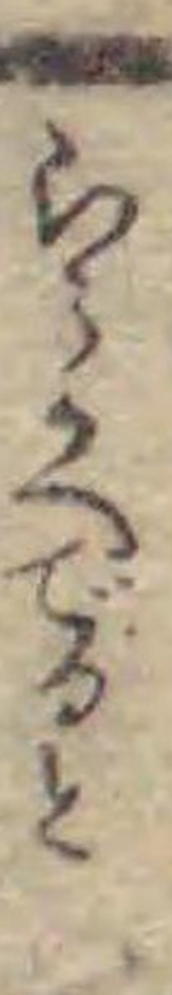らうかへでると
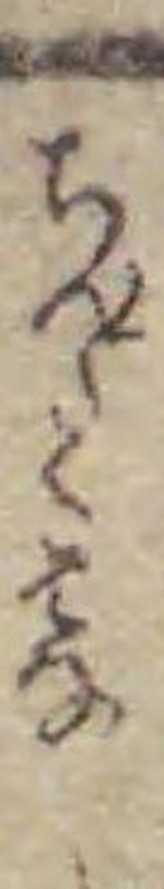ちん〳〵とはな
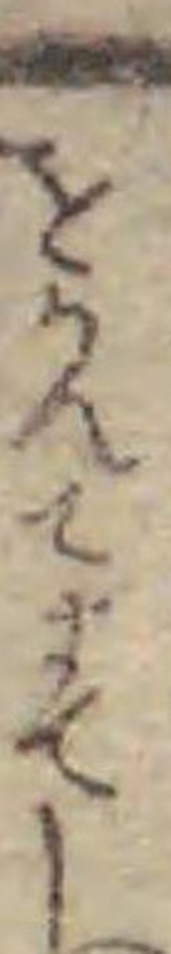をかんてすて
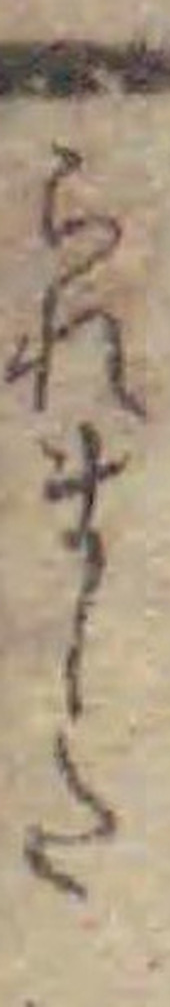られました

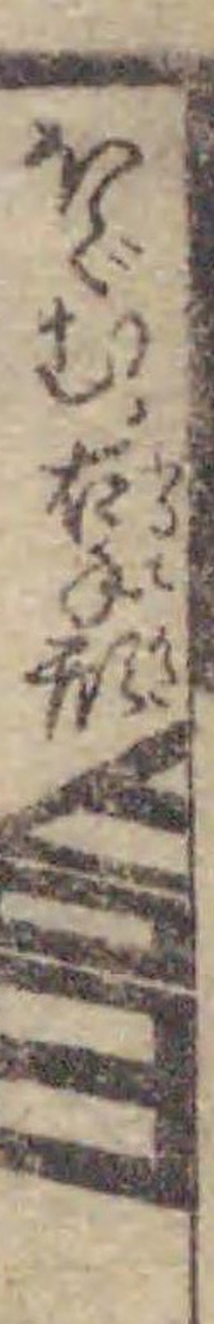ほぐむ古手形
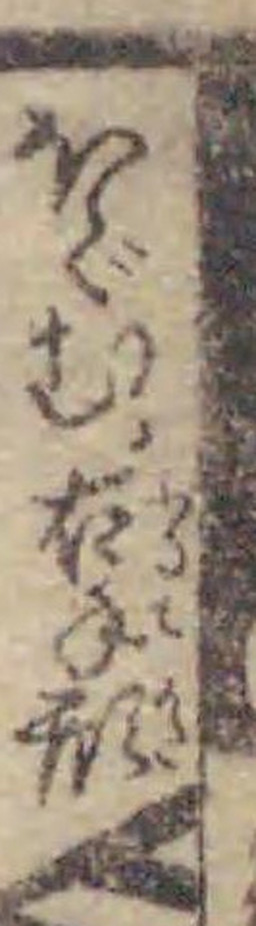ほぐむ古手形
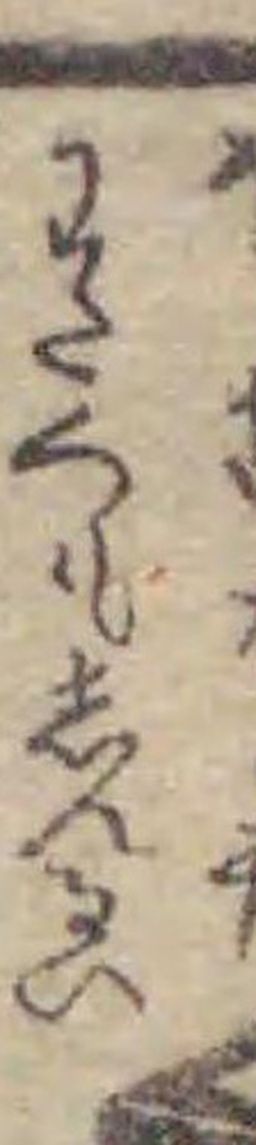わたくもしんるい
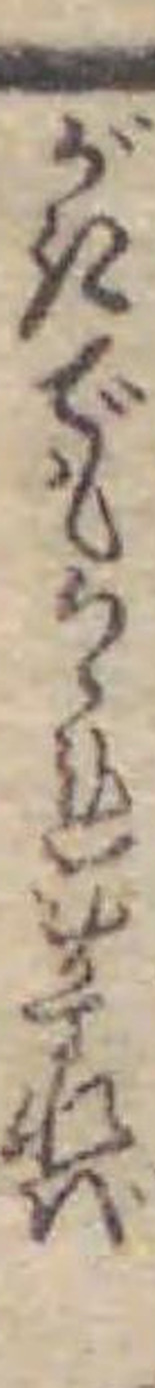がきでもかゝれますれば
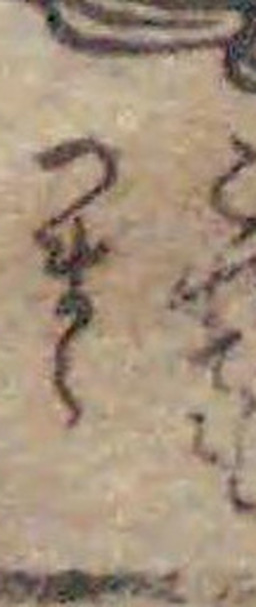つまら
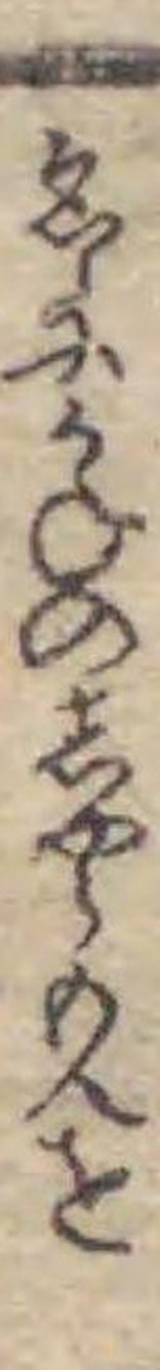ゑゝにかねのしやうもんを
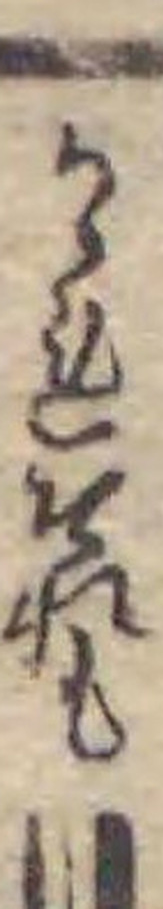かゝれそれも
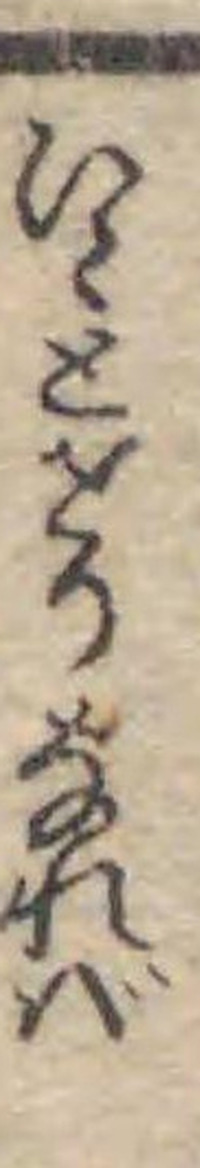ひととをりなれば
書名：紙屑身上噺 : 3巻
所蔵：国立国会図書館 National Diet Library, JAPAN
